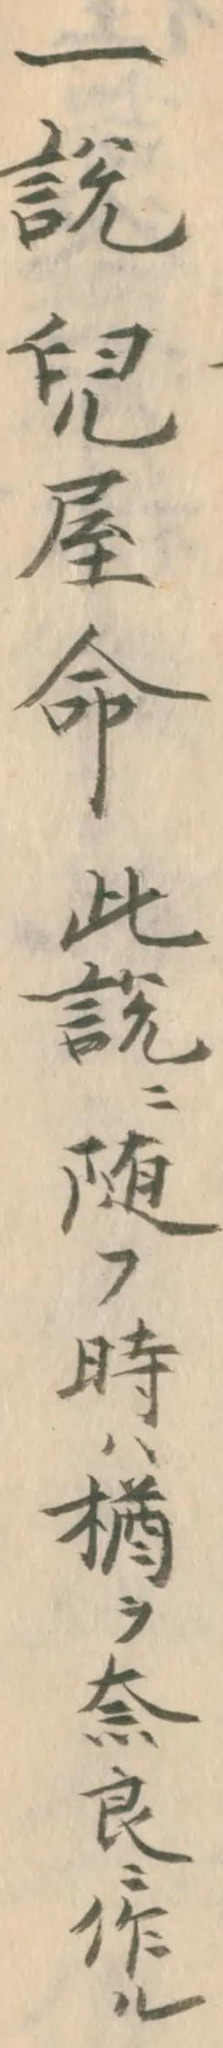一説児屋命此説ニ随フ時ハヲ奈良ニ作ル
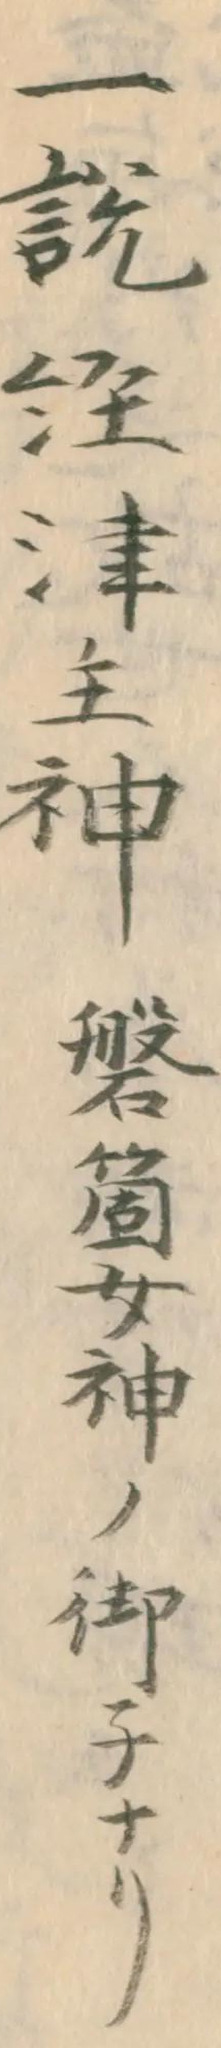一説経津主神磐箇女神ノ御子ナリ
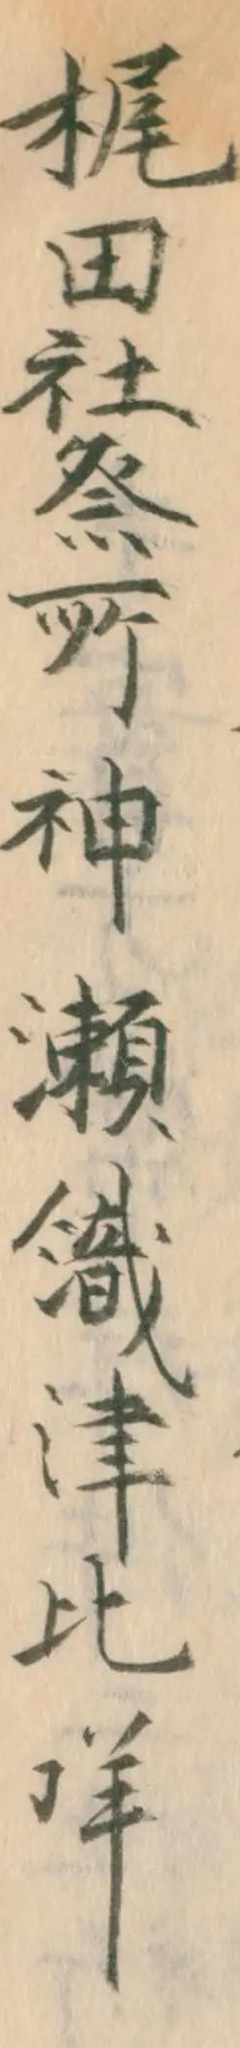梶田社祭所神瀬織津比咩
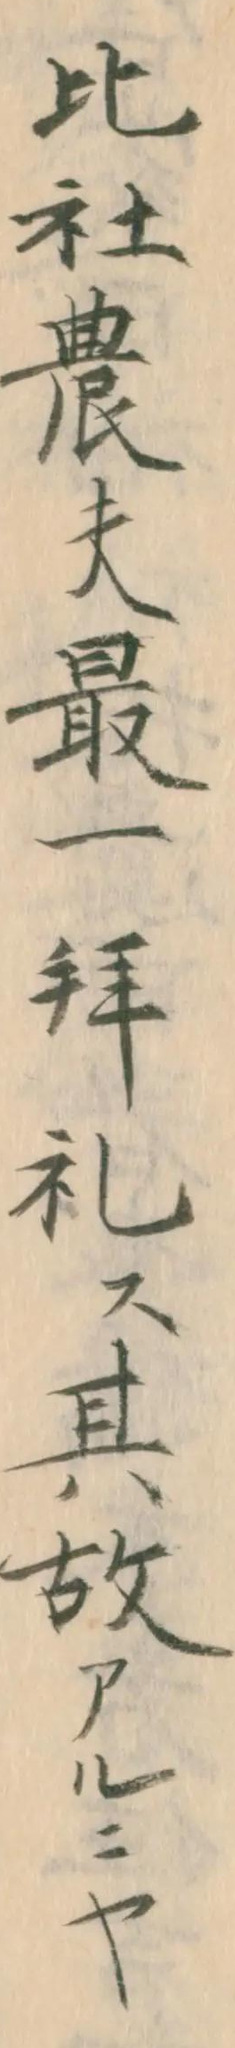比社農夫最一拝礼ス其故アルニヤ
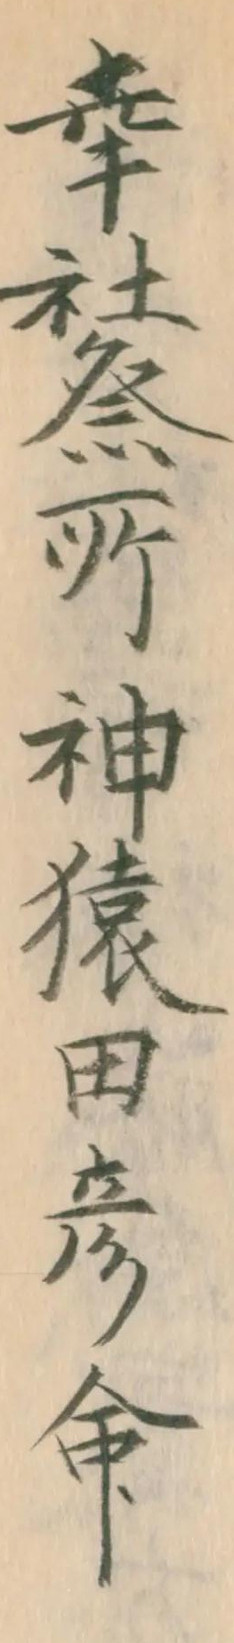幸社祭所神猿田彦命
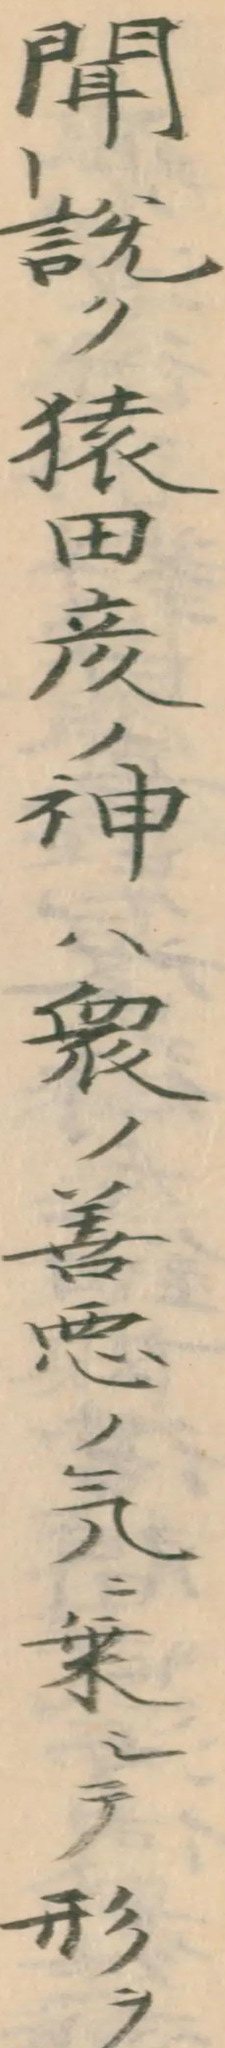聞説ク猿田彦ノ神ハ衆ノ善悪ノ気ニ乗シテ形ヲ
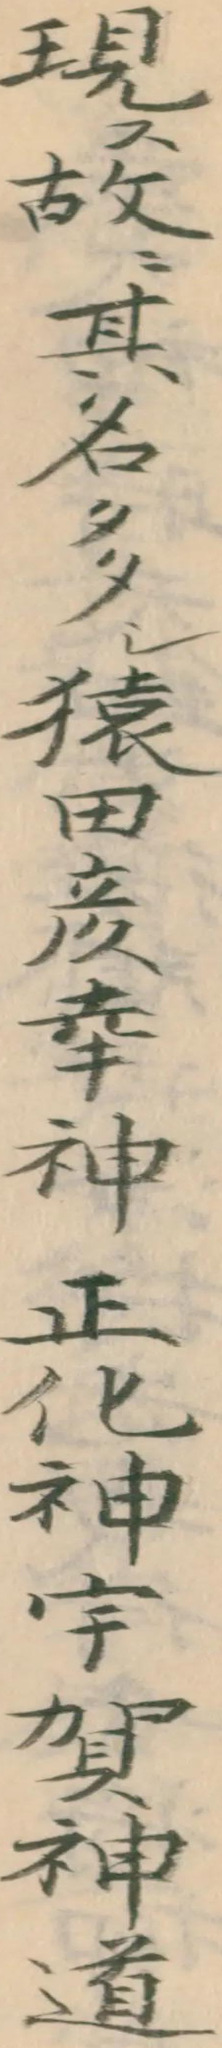現ス故ニ其名多シ猿田彦幸神正化神宇賀神道
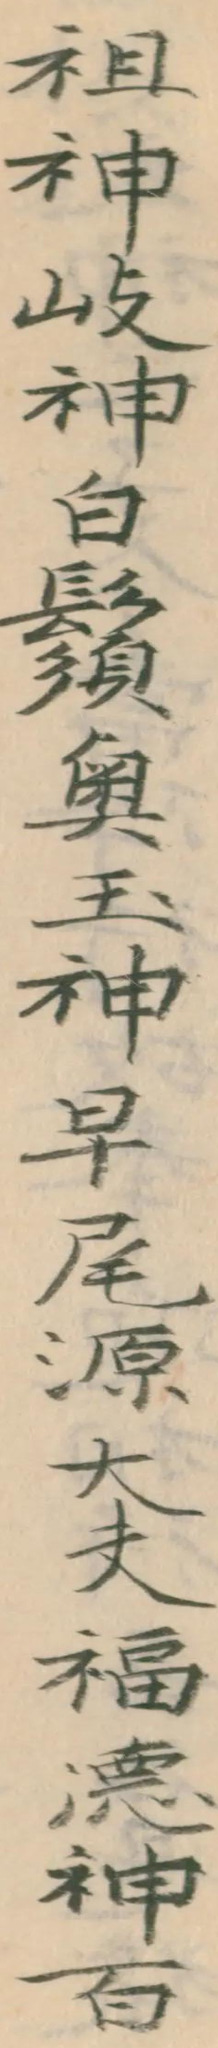祖神岐神白鬚奥玉神早尾源大夫福徳神百
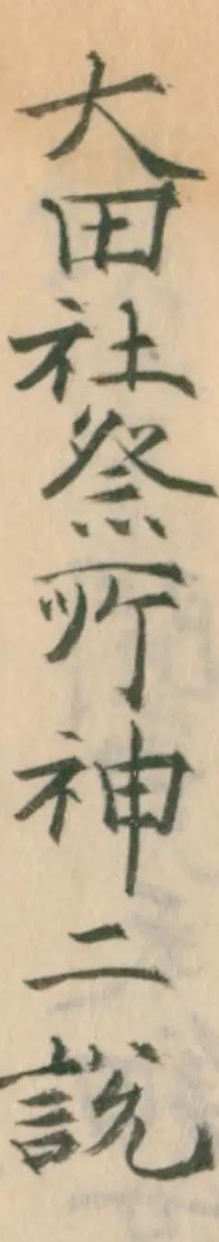大田社祭所神二説
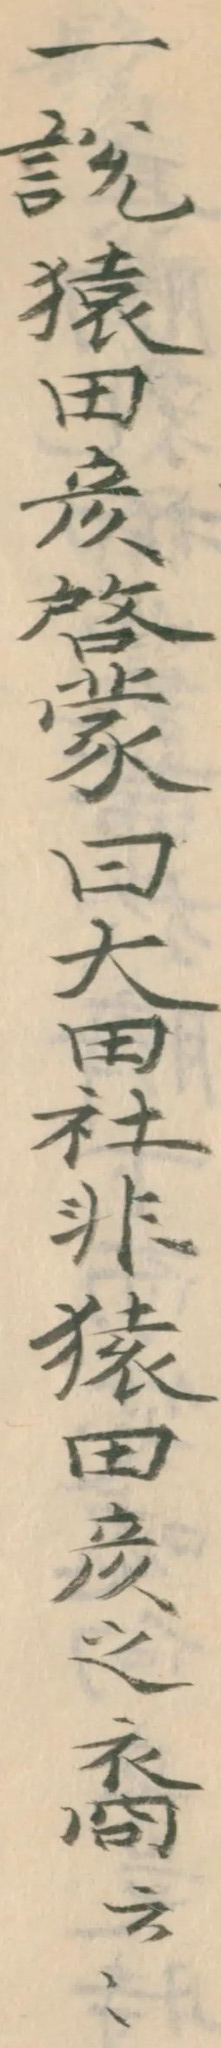一説猿田彦啓蒙曰大田社非猿田彦之裔云々
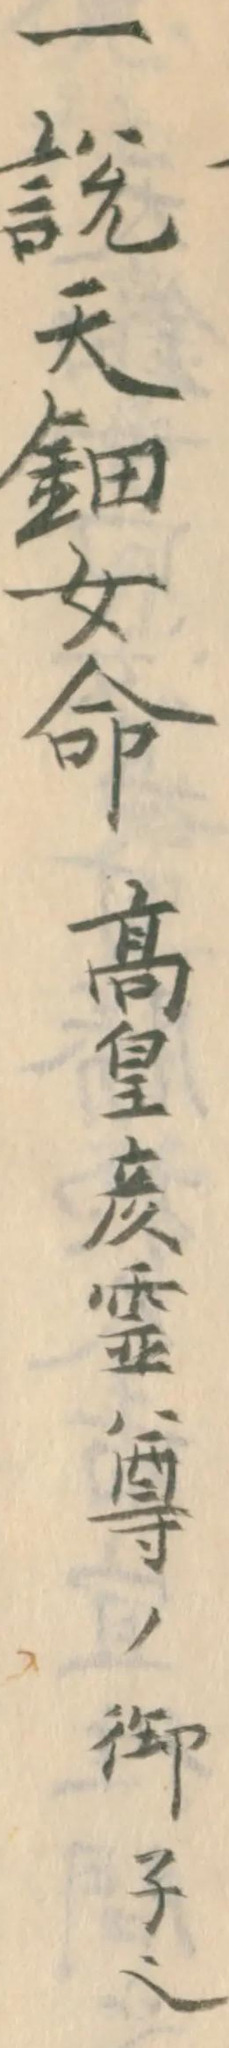一説天鈿女命高皇彦霊尊ノ御子也
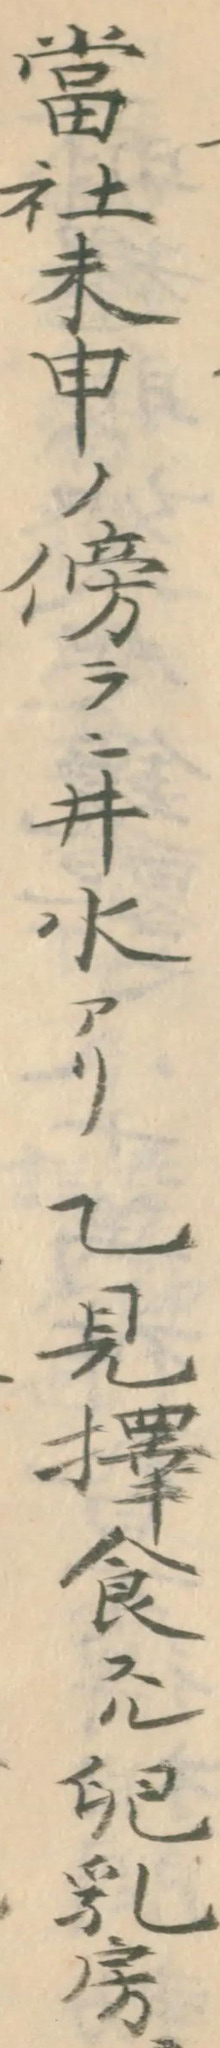当社未申ノ傍ラニ井水アリ乙見択食スル卵乳房ニ
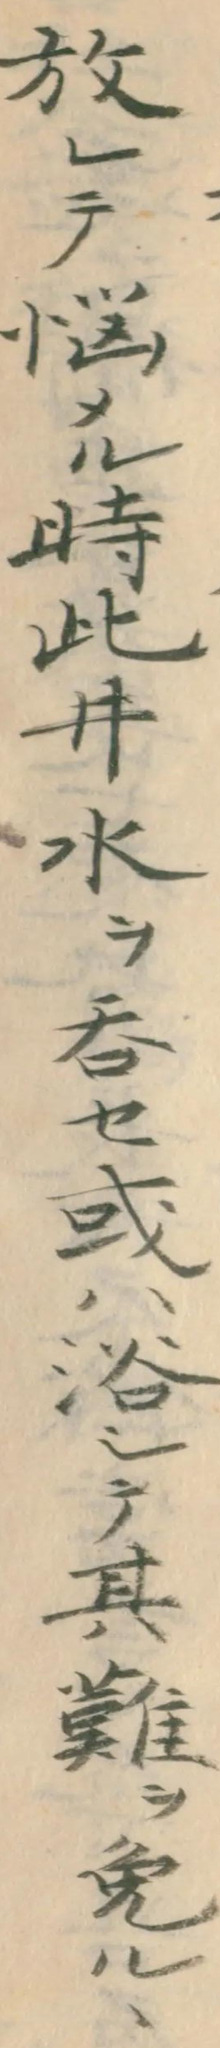放レテ悩メル時此井水ヲ呑セ或ハ浴シテ其難ヲ免ルヽ
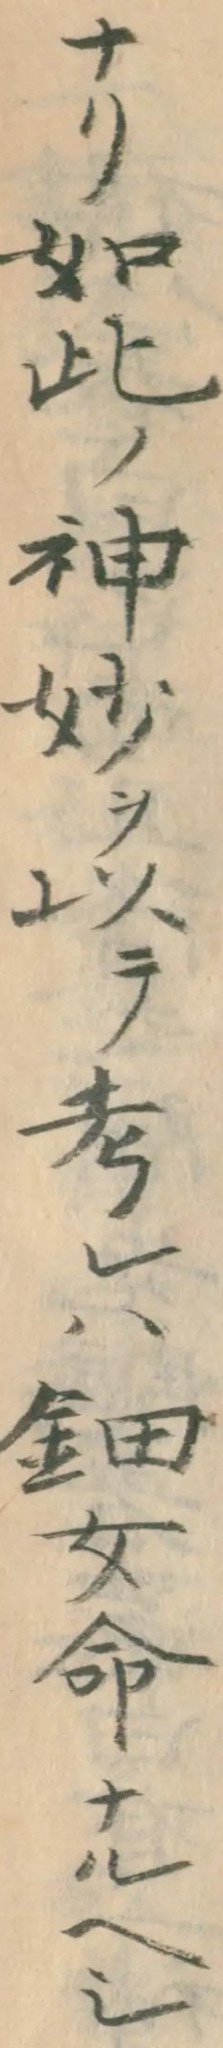ナリ如此ノ神妙ヲ以テ考レハ細女命ナルヘシ

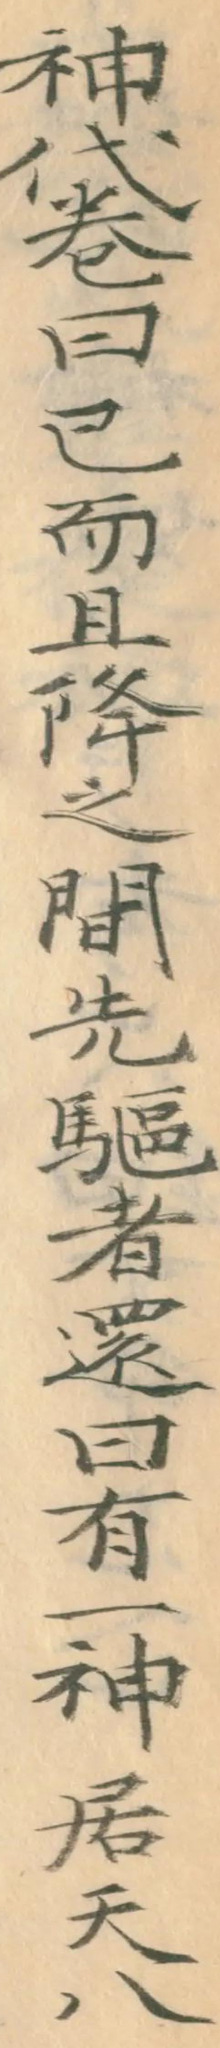神代巻曰巳而且降之間先駆者還曰有一神居天八
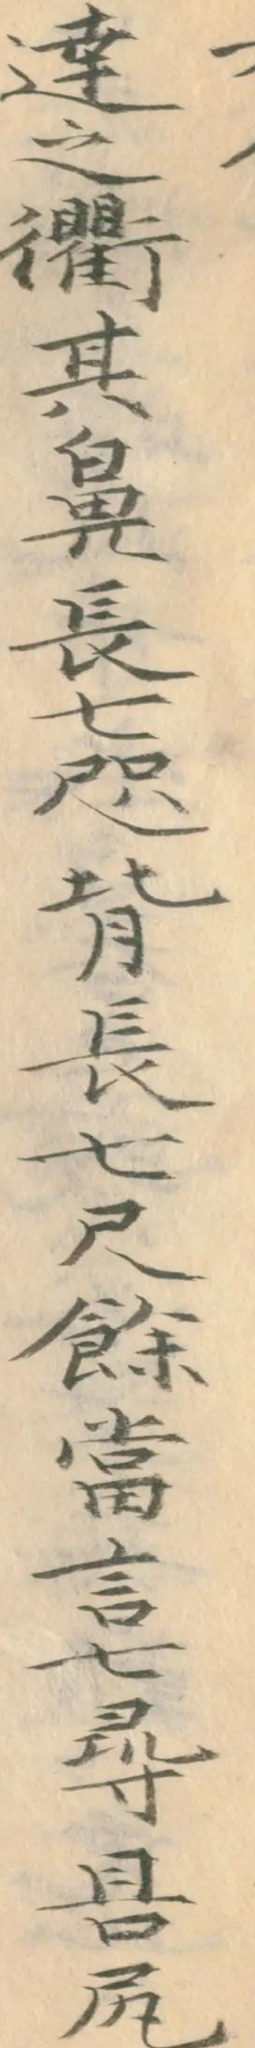達之衢其鼻長七咫背長七尺余当言七尋咀尻
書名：賀茂社記録. 第91冊
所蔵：国立国会図書館 National Diet Library, JAPAN
